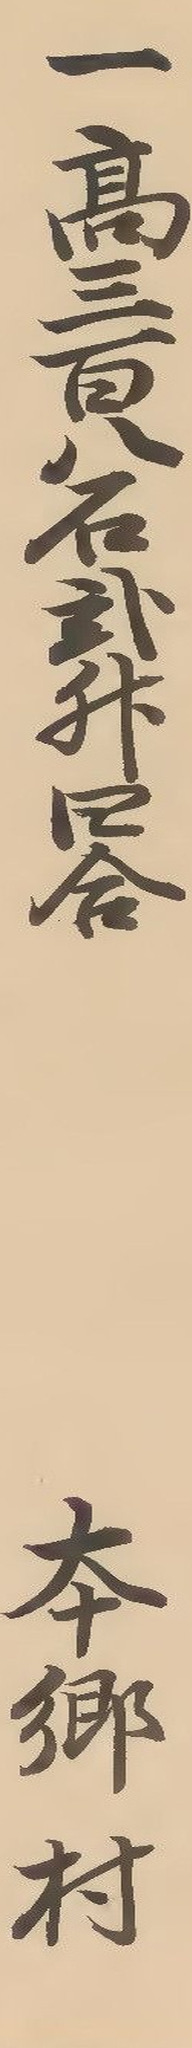一高三百八石弐升四合本郷村
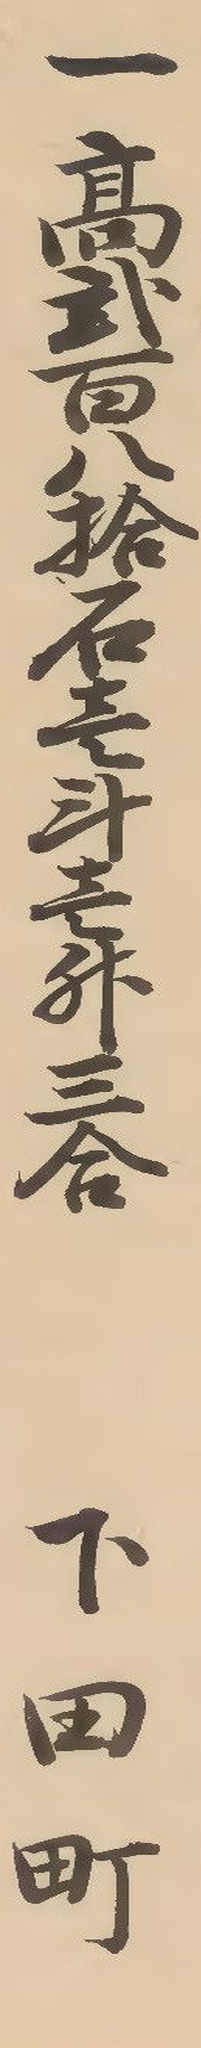一高弐百八拾石壱斗壱升三合下田町
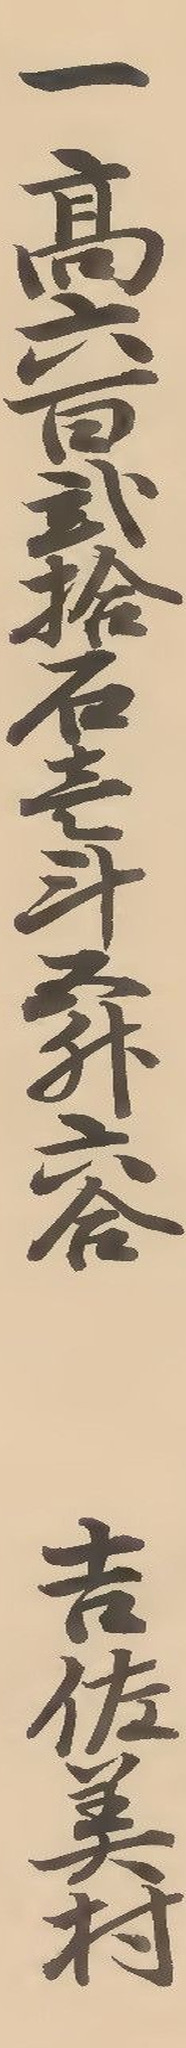一高六百弐拾石壱斗五升六合吉佐美村
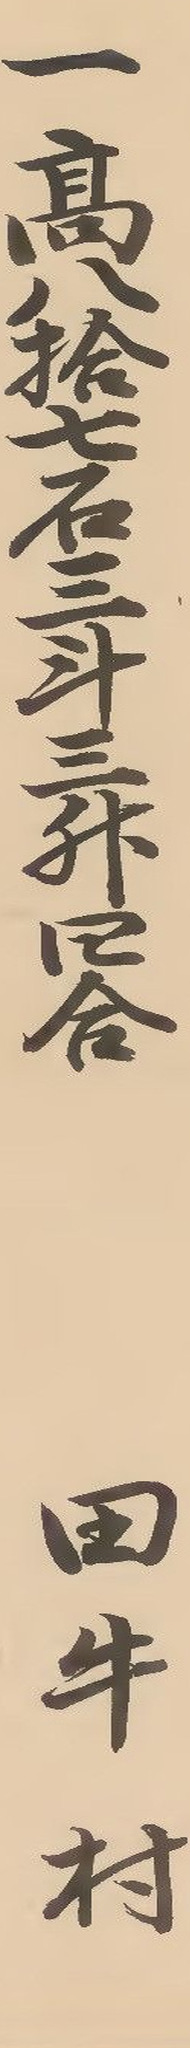一高八拾七石三斗三升四合田牛村
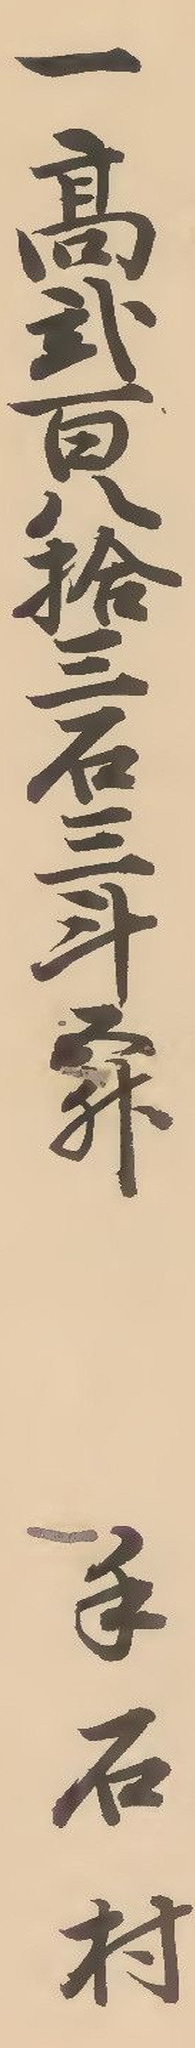一高弐百八拾三石三斗五升手石村

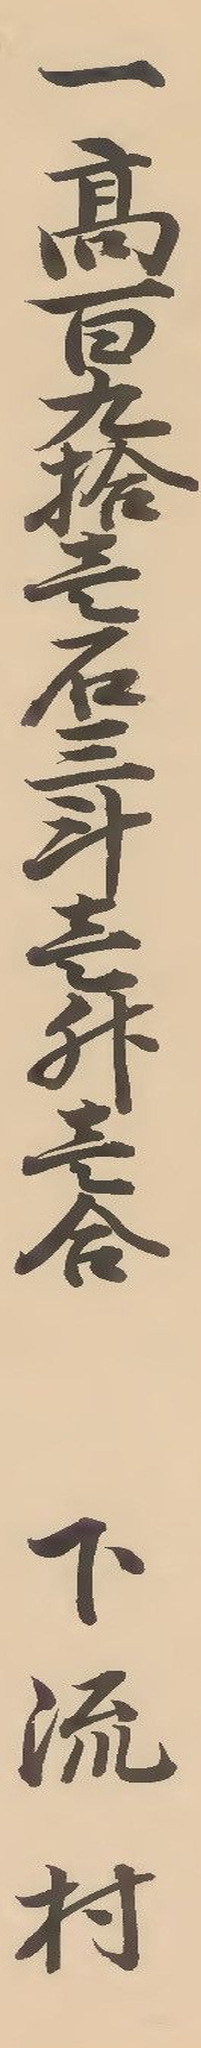一高百九拾壱石三斗壱升壱合下流村
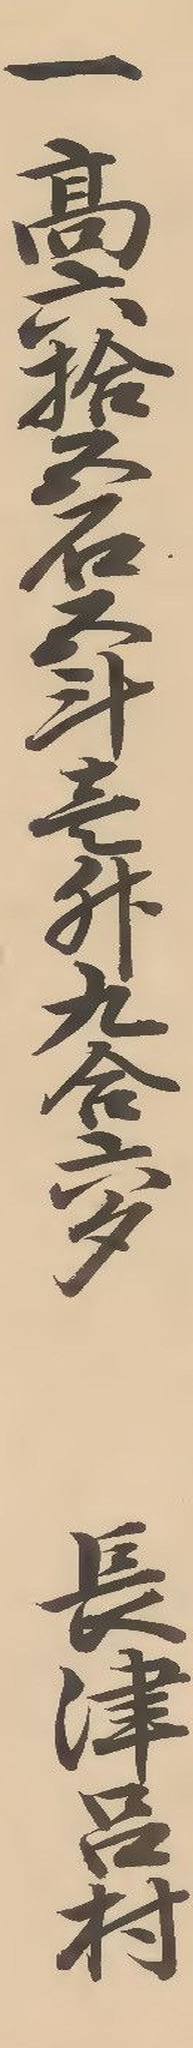一高六拾五石五斗壱升九合六勺長津呂村
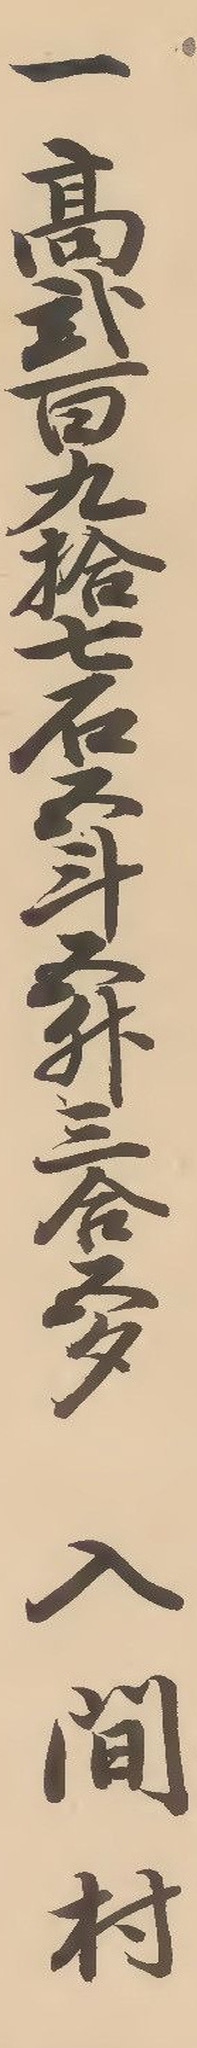一高弐百九拾七石五斗五升三合五勺入間村
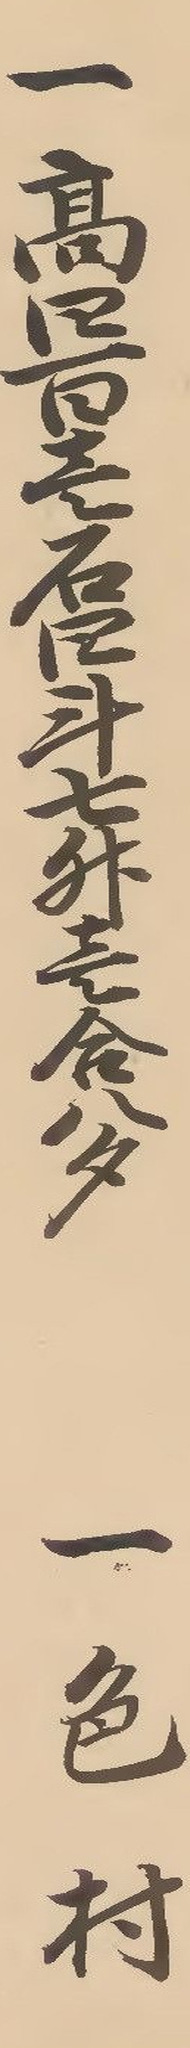一高四百壱石四斗七升壱合八勺一色村
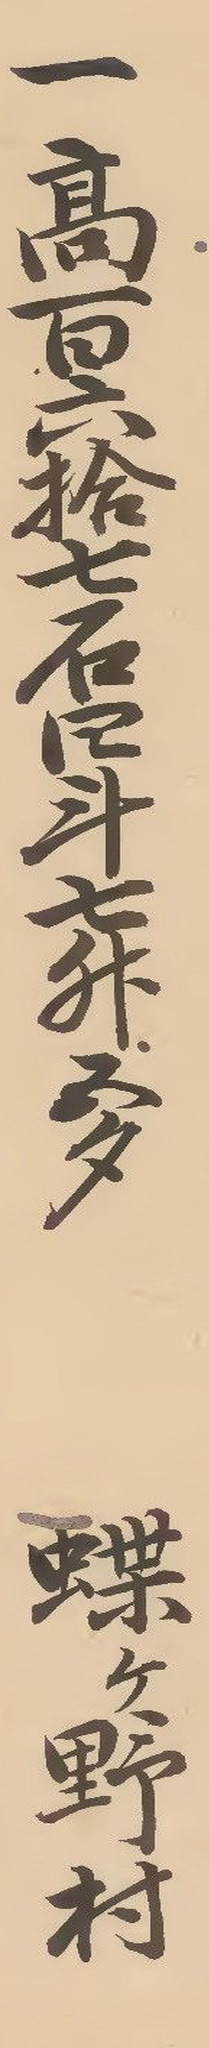一高百六拾七石四斗七升五勺蝶ヶ野村

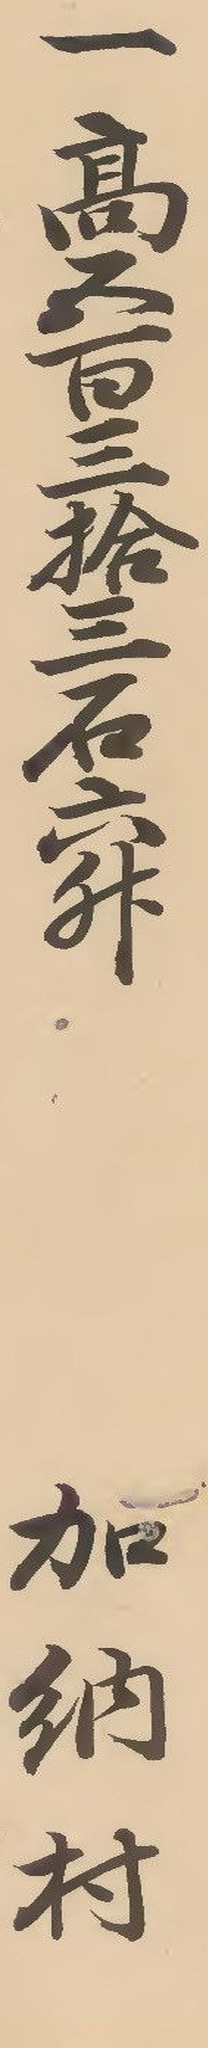一高五百三拾三石六升加納村
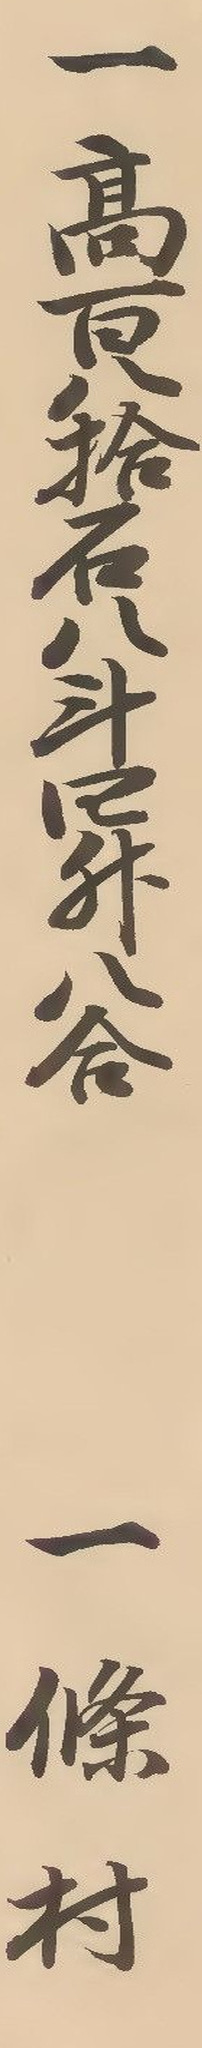一高百八拾石八斗四升八合一条村
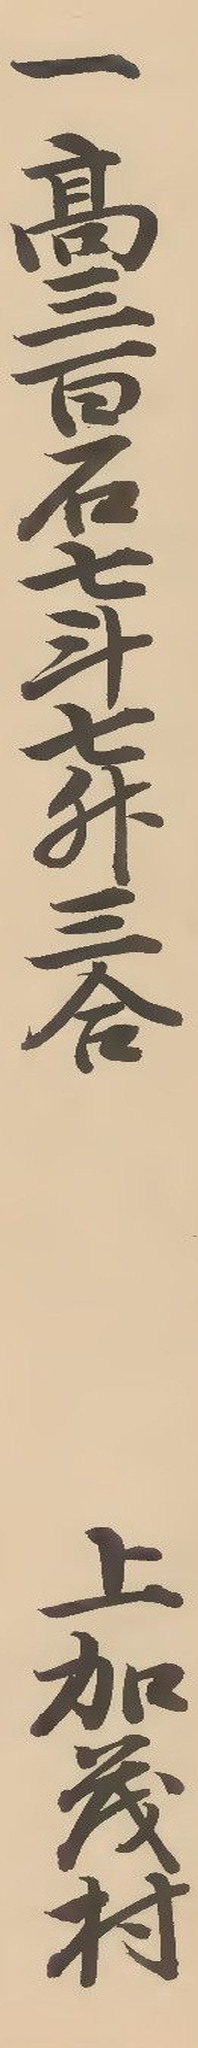一高三百石七斗七升三合上加茂村
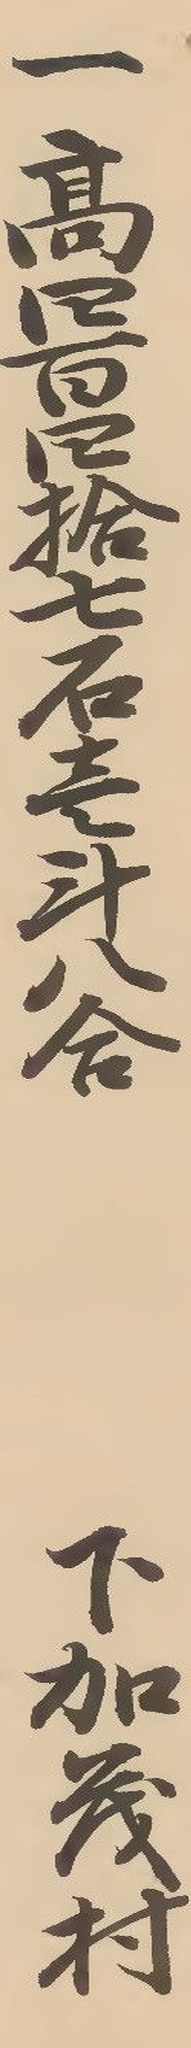一高四百四拾七石壱斗八合下加茂村
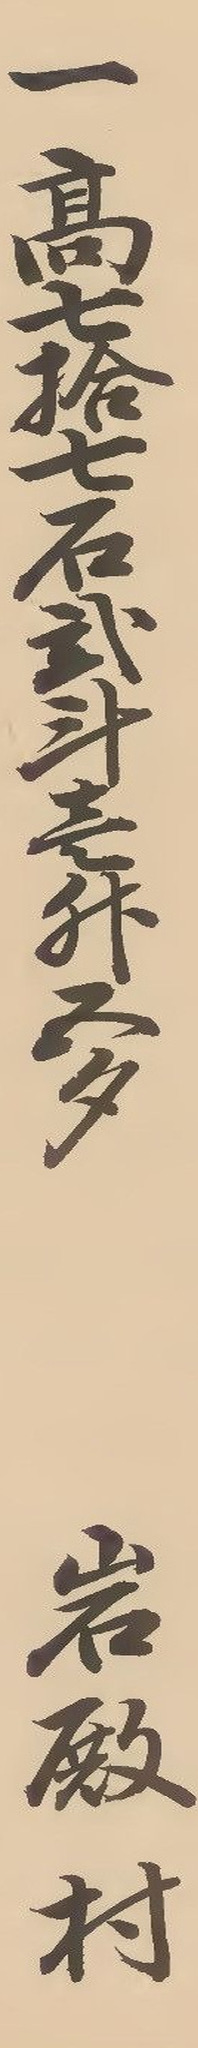一高七拾七石弐斗壱升五勺岩殿村
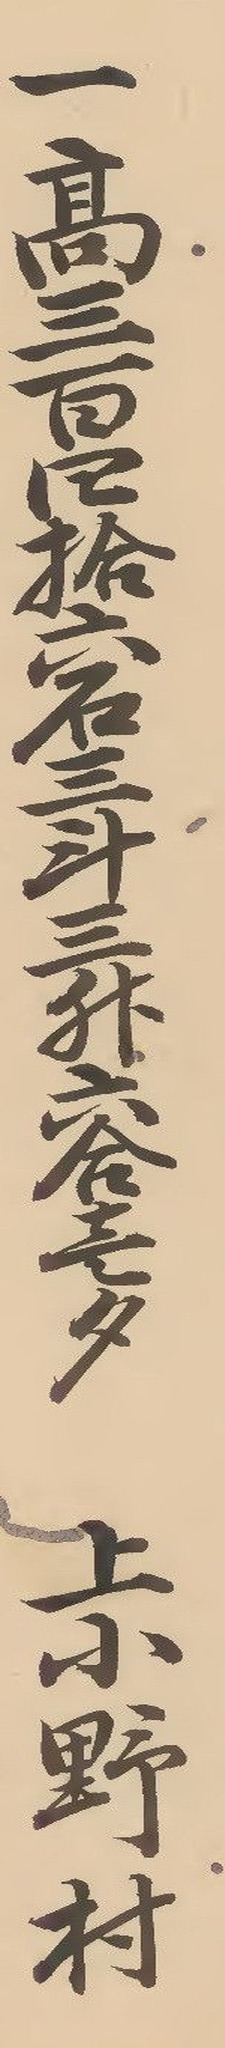一高三百四拾六石三斗三升六合壱勺上小野村
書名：伊豆国郷帳
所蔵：国立公文書館 National Archives of Japan
